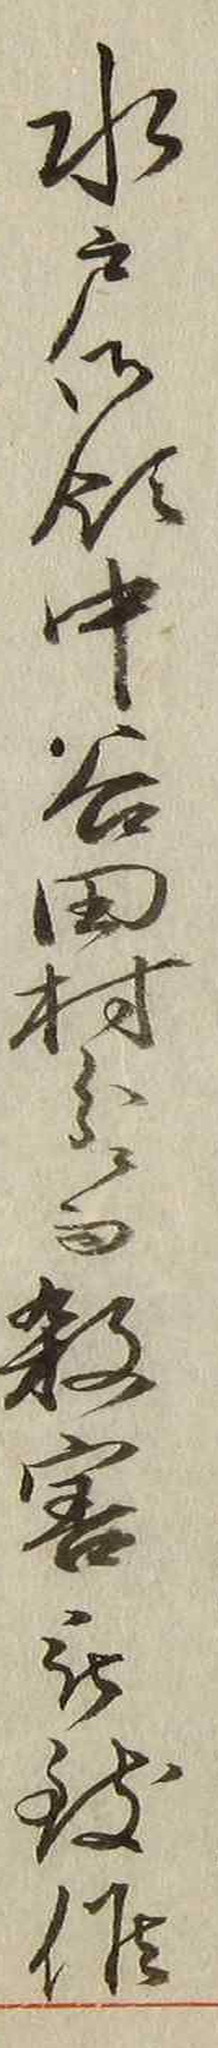水戸御領中谷田村分ニ而殺害被致候
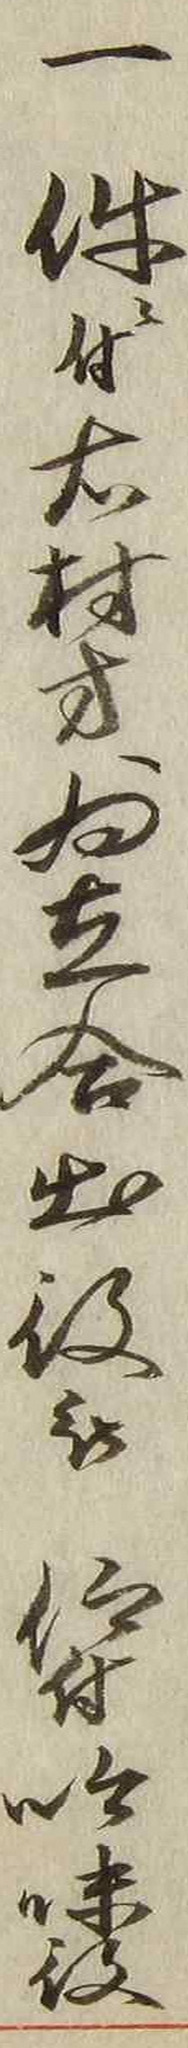一件ニ付右村方へ為立合出役被仰付吟味役
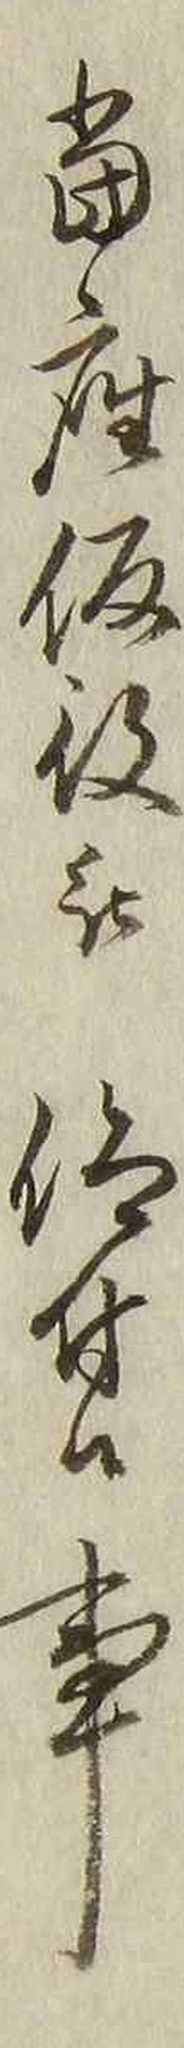当座仮役被仰付候事
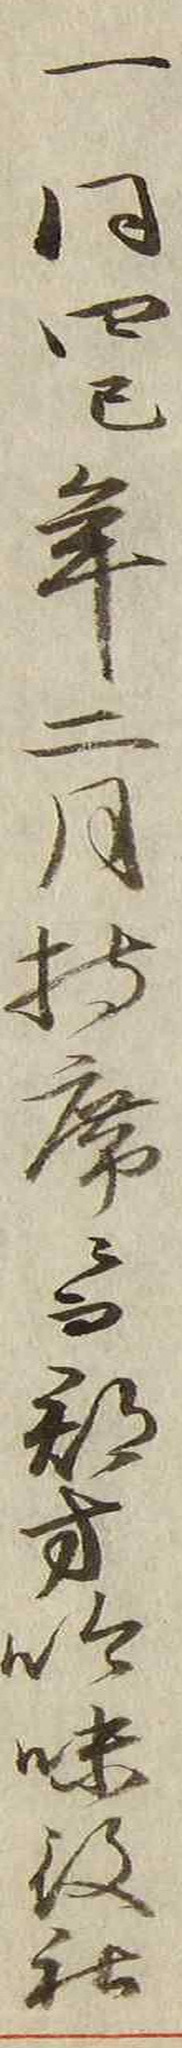一同四巳年二月持席ニ而郡方吟味役社
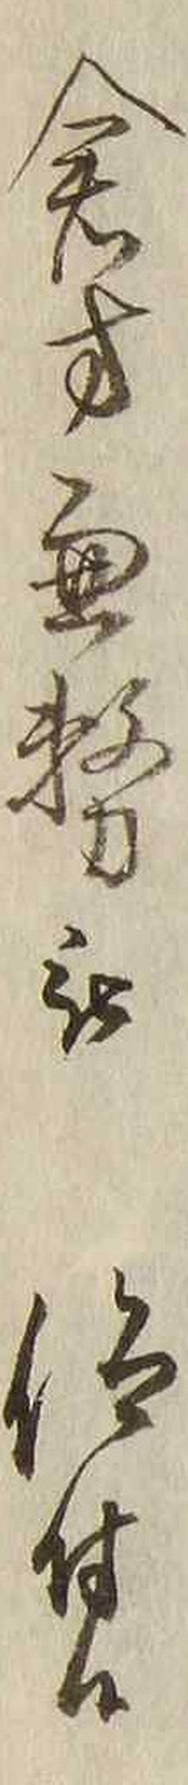倉方兼務被仰付候

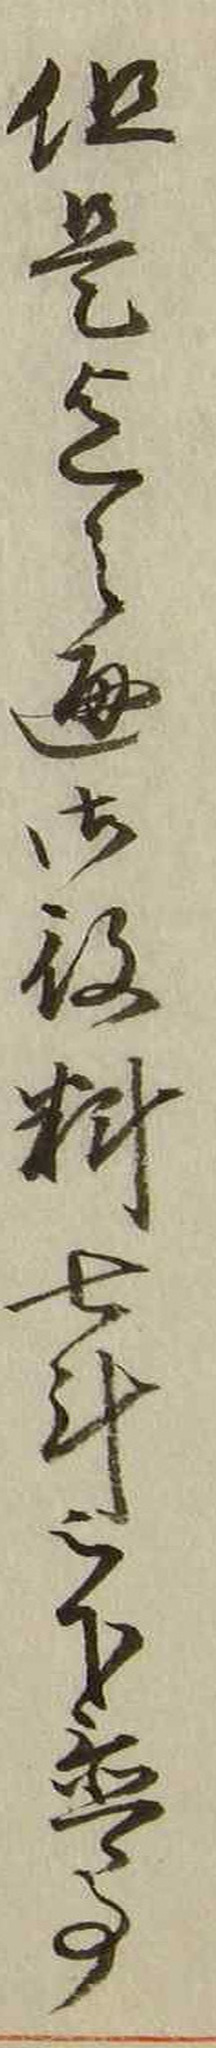但是迄之通御役料七斗被下置候事
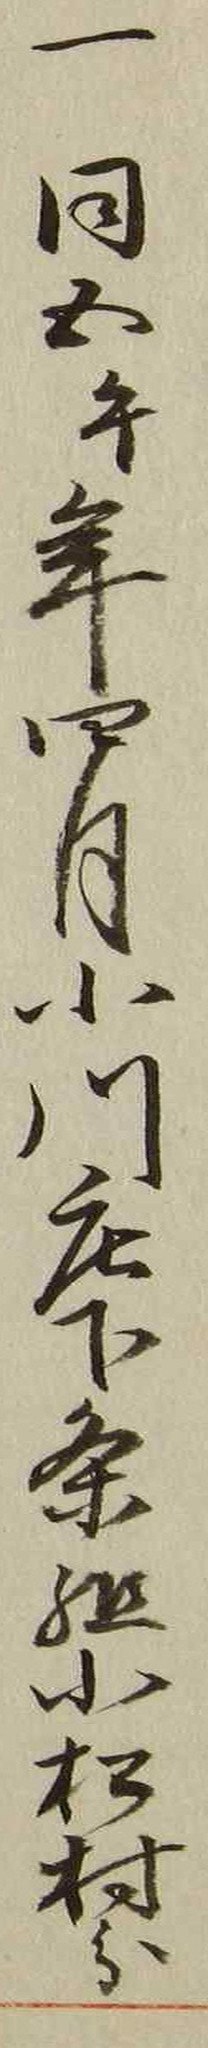一同五午年四月小川庄下条組小松村分
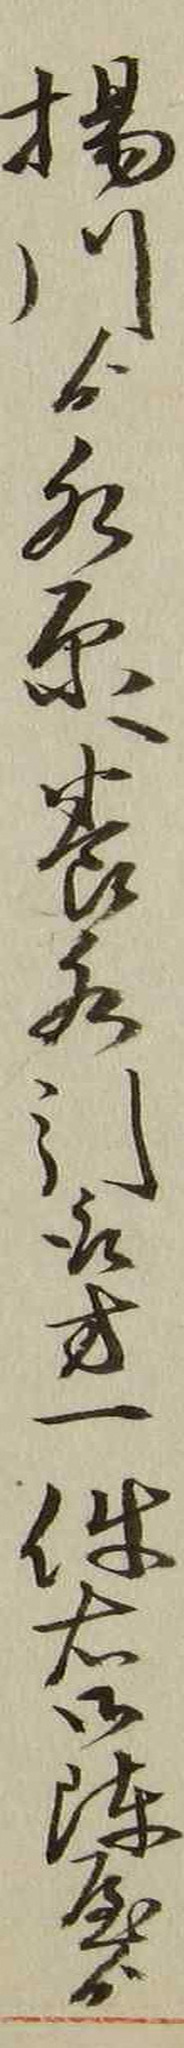揚川ゟ水原へ養水引取方一件右御陣屋ゟ
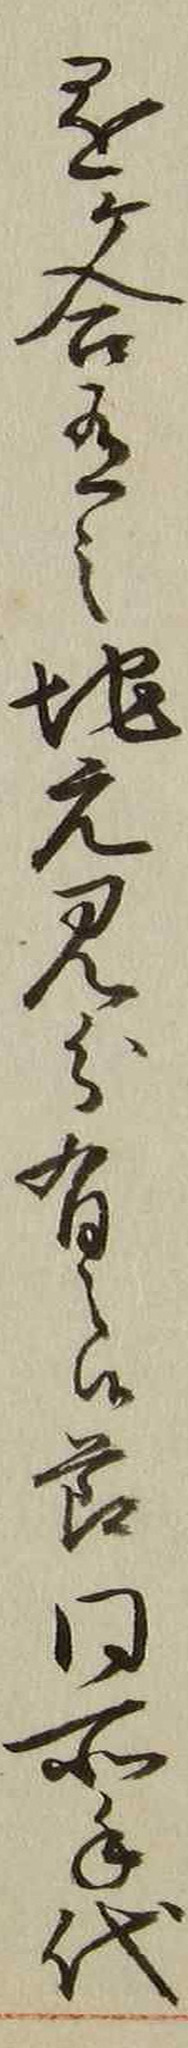懸ケ合有之地元見分有之候節同所手代
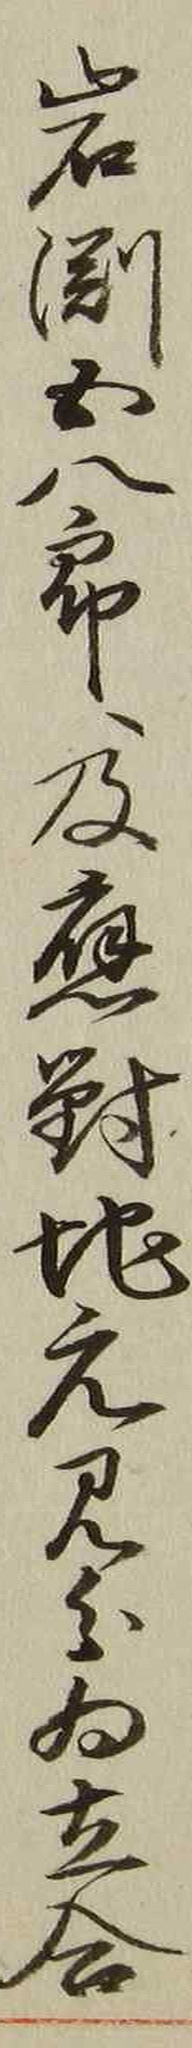岩淵五八郎へ乃応対地元見分為立合
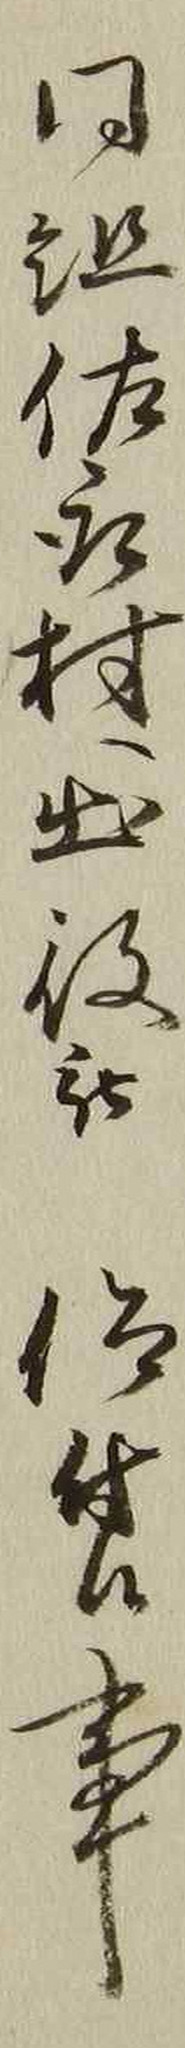同組佐取村へ出役被仰付候事
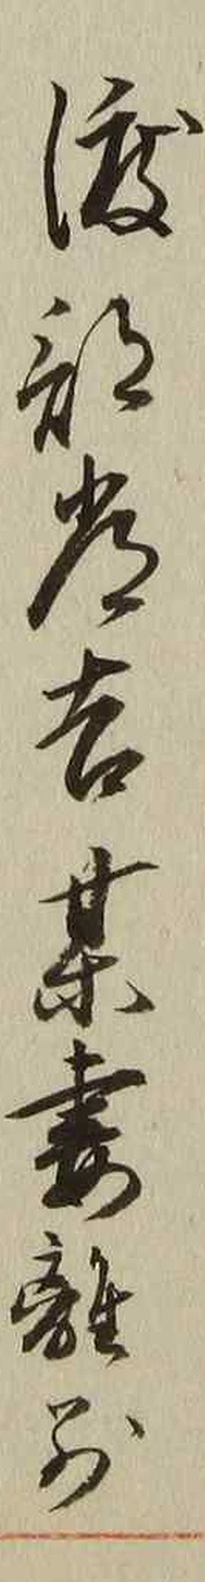女渡部常吉某妻離別
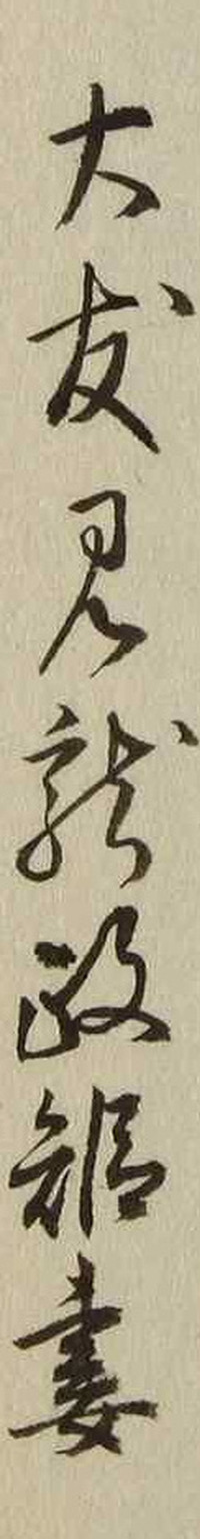大友見龍政矩妻
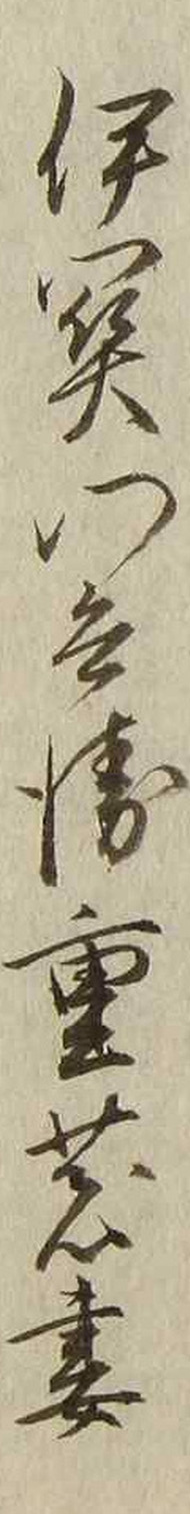女伊関門兵衛重慶妻
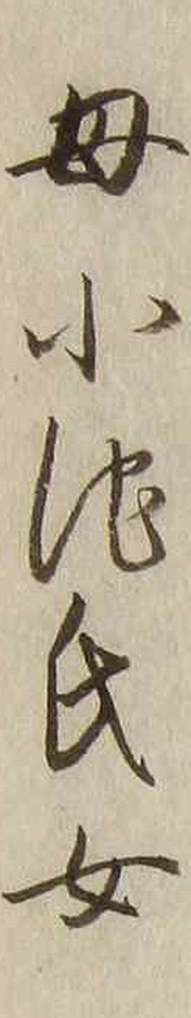母小池氏女

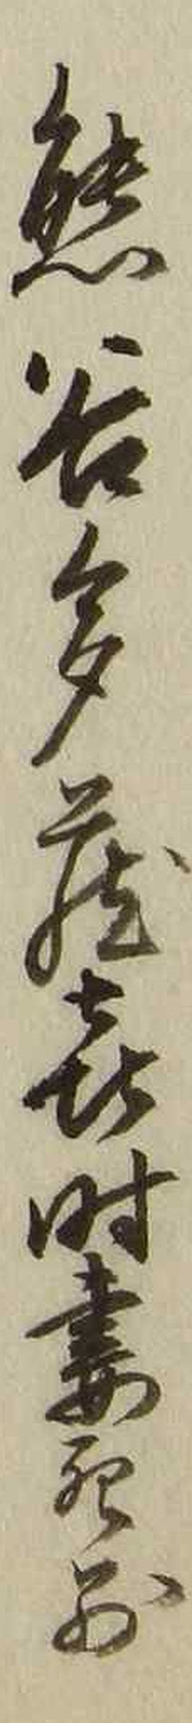女熊谷多蔵喜時妻死別
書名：諸士系譜　巻之102　か之部10
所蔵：会津若松市立会津図書館
